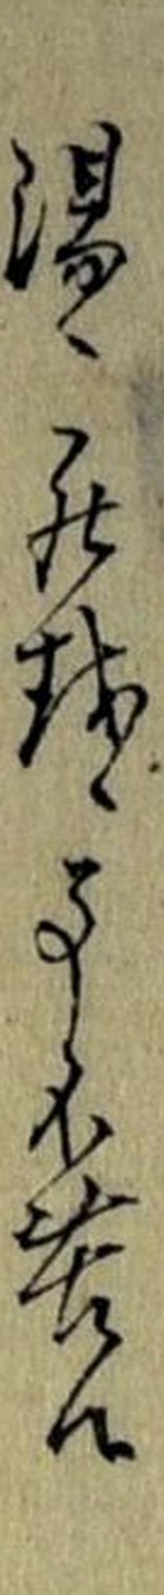湯へ罷越候事不苦候
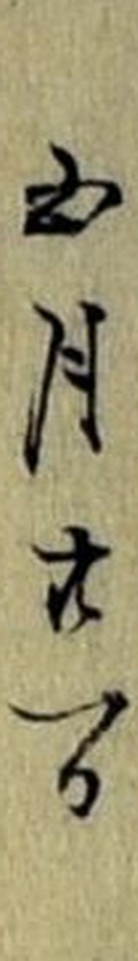五月廿一日
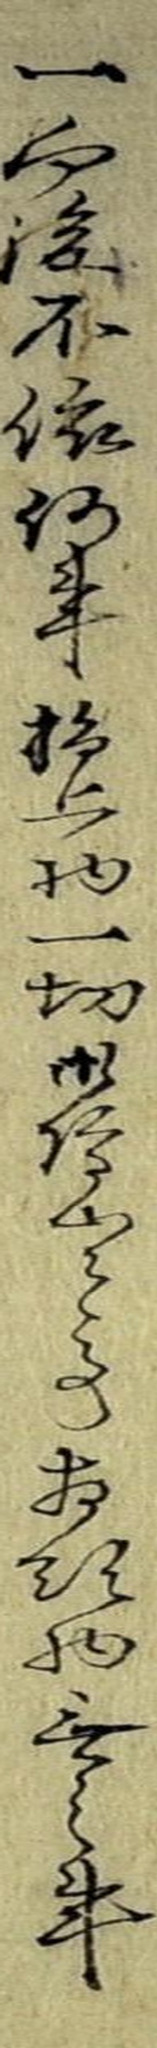一向後不依何事指上物一切御停止ニ候事拝領物無之事
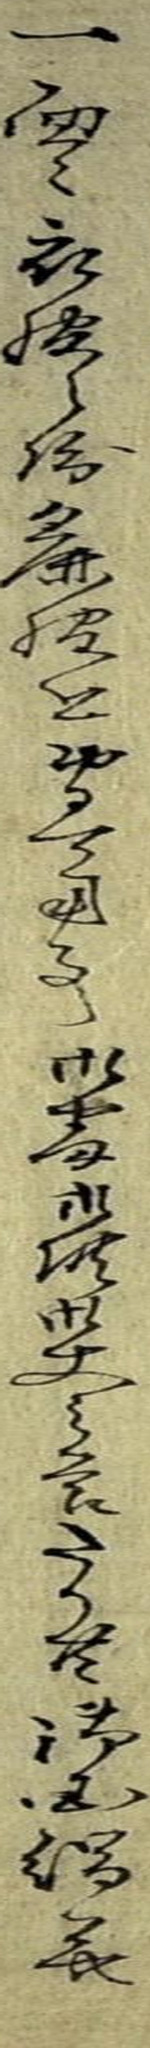一面々衣服之儀麁服を専可用事御番御供御使之節たり共御国絽并
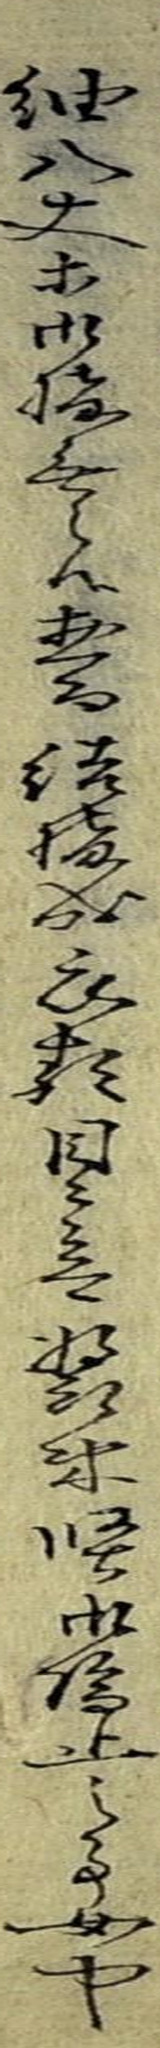紬八丈等御構無之候惣而結構成衣類目ニ立候装束堅御停止之事女中
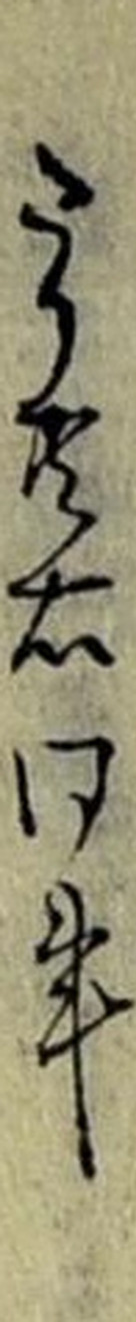たり共右同事
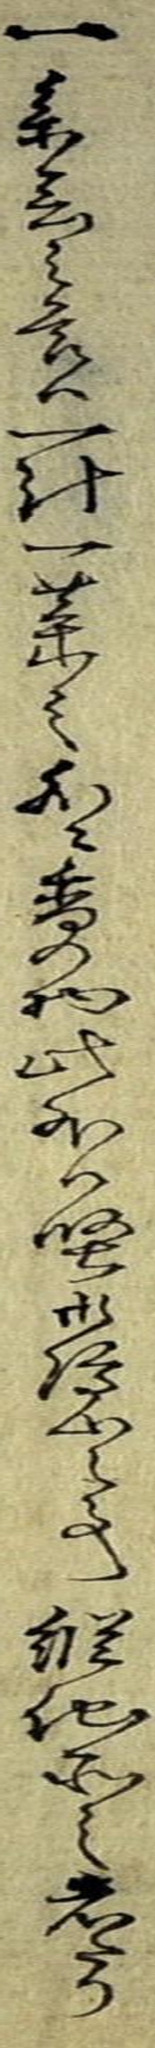一参会之節ハ一汁一菜之外ニ香の物此外ハ堅御停止之事縦他所之者たり
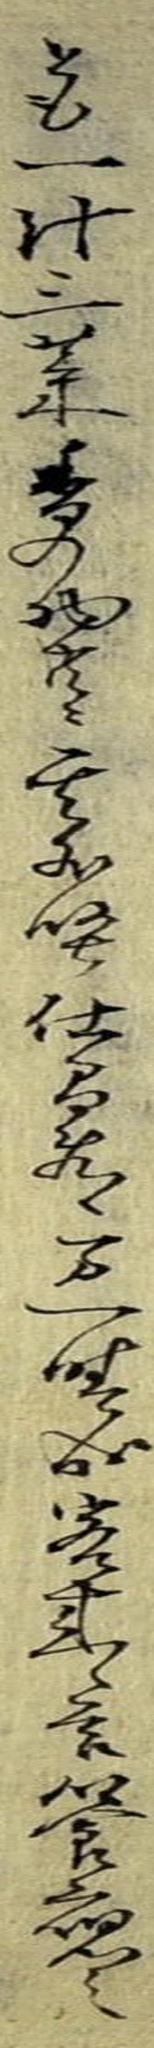とも一汁三菜香の物共ニ其外堅仕間敷候万一晴成客来候節饗応之
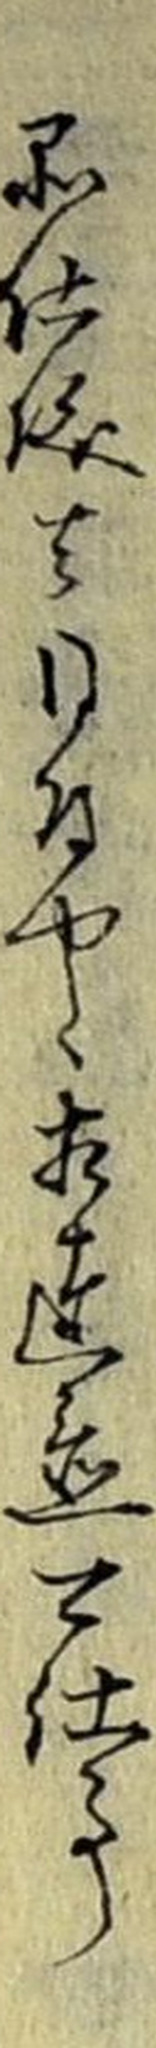品仕儀者目付中へ相達置可仕事
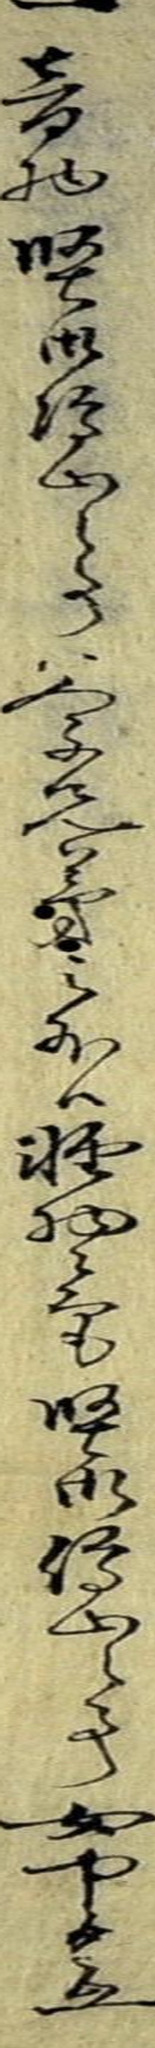一音物堅御停止之事父子兄弟之外ハ軽物ニ而も堅御停止候事女中互
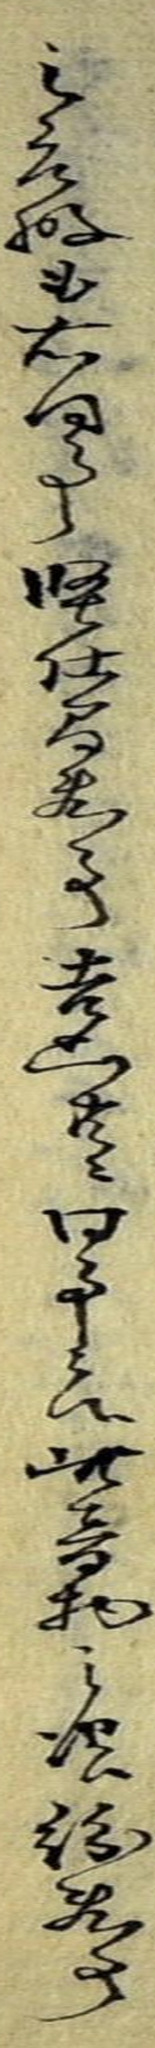之取扱も右同事堅仕間敷事吉凶共ニ同事ニ候此音物之儀ハ紛敷事

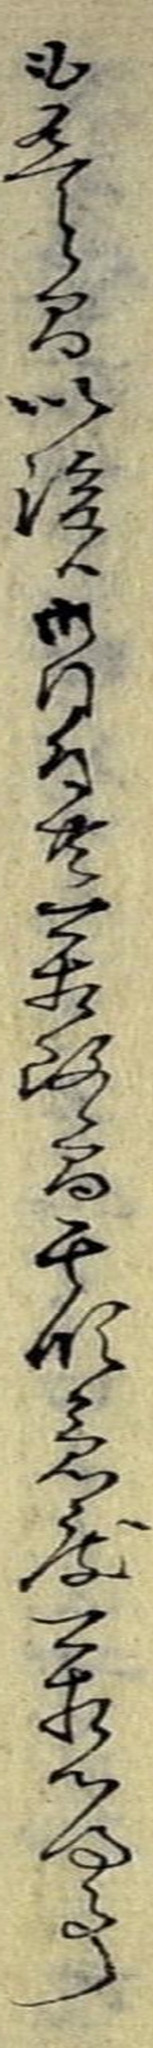も有之候間以後ハ御目付共可相改候間其段急度可相心得事
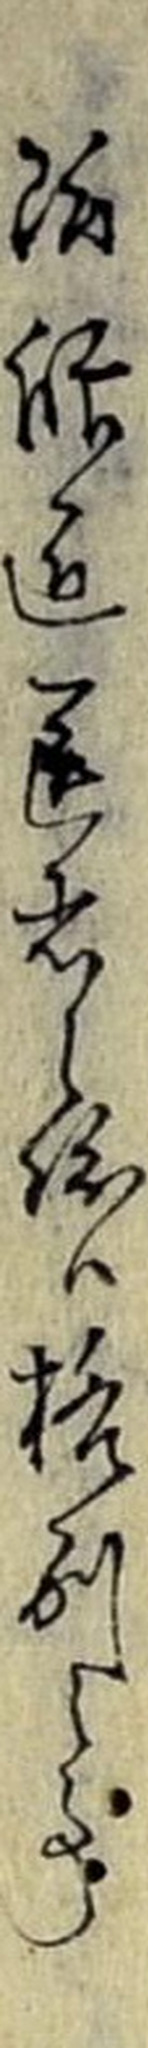附師匠医者之儀ハ格別之事
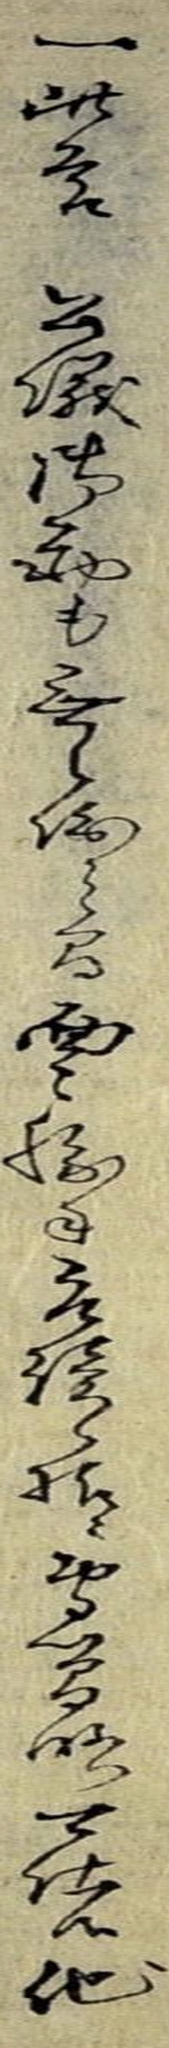一此節公儀御勤も無之儀ニ候間面々勝手取続候様ニ専簡略可仕候他
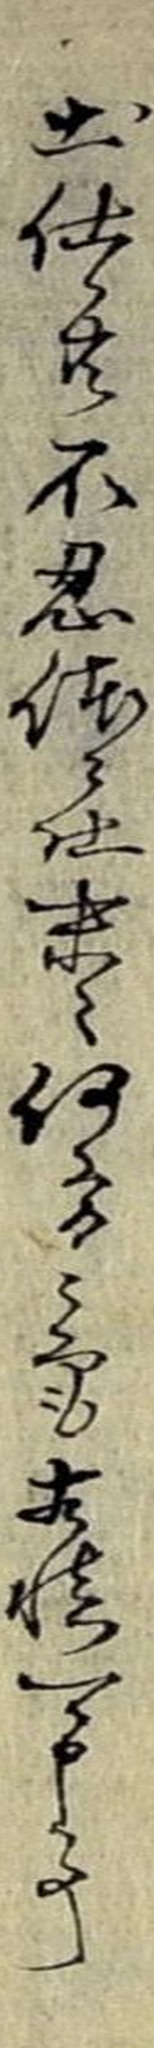出仕候共不忍体ニ仕末々何方ニ而も相慎可申事
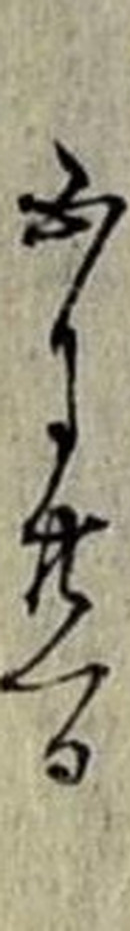五月廿一日
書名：命令之部 一
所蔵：福井県文書館 Fukui Prefectural Archives
